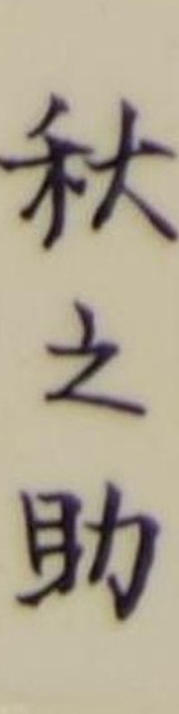秋之助

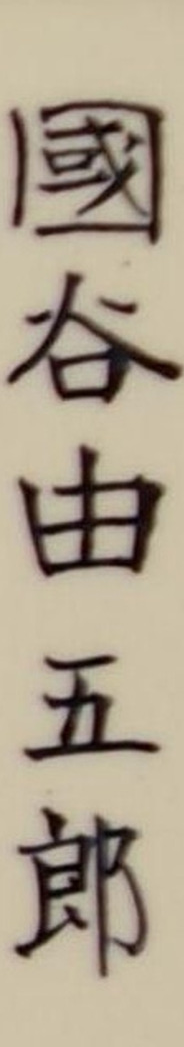國谷由五郎
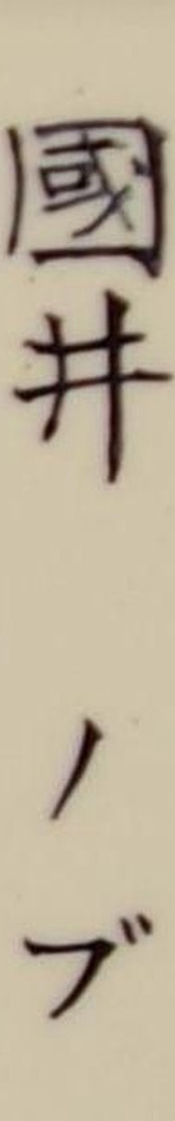國井ノブ
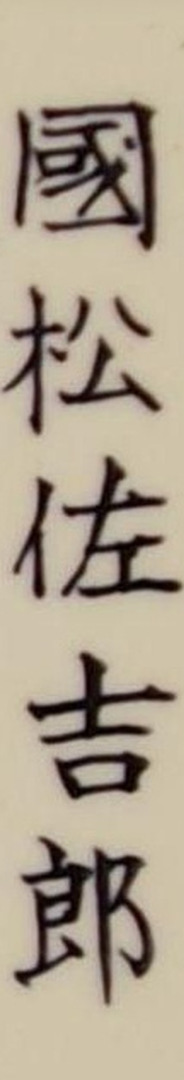國松佐吉郎
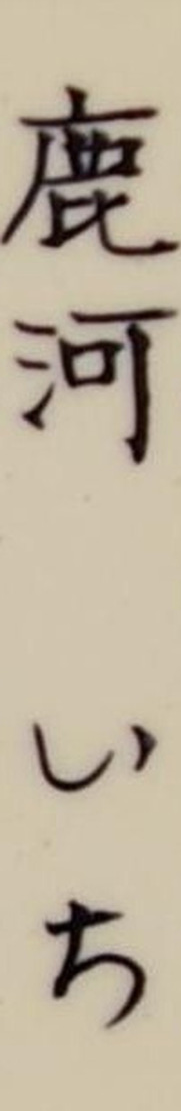鹿河いち
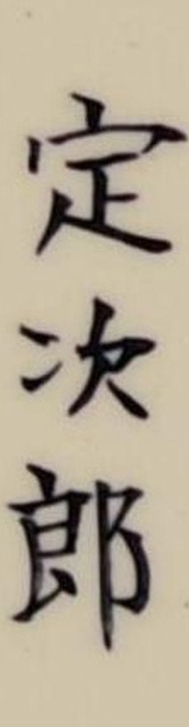定次郎
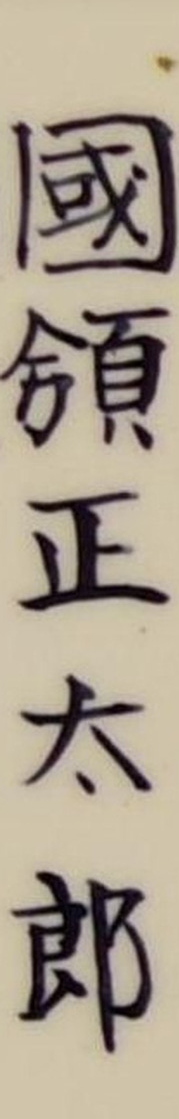國領正太郎
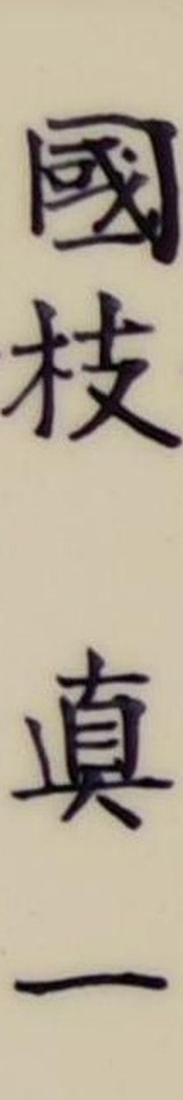國枝真一
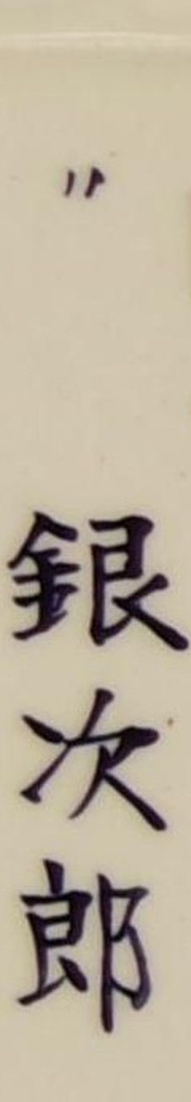銀次郎
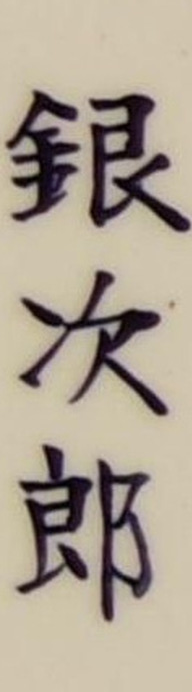銀次郎
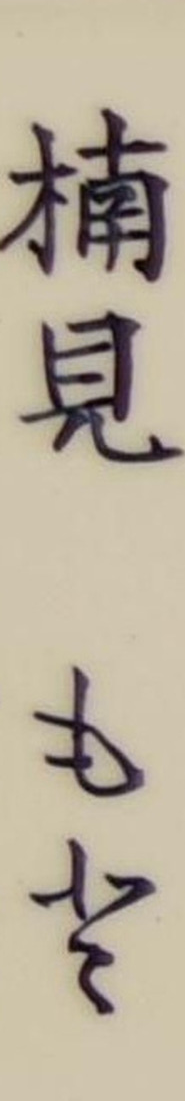楠見もと
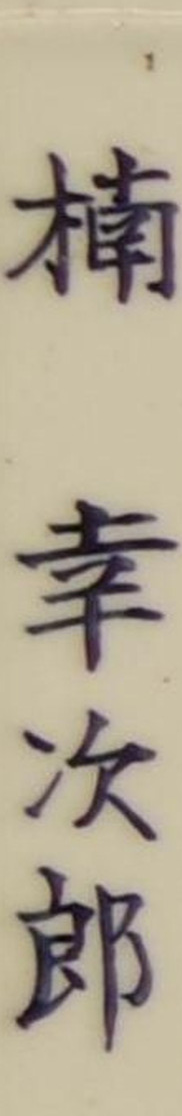楠幸次郎

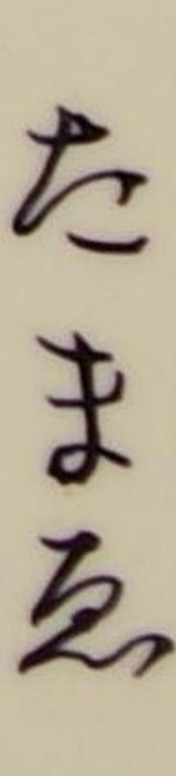たまゑ
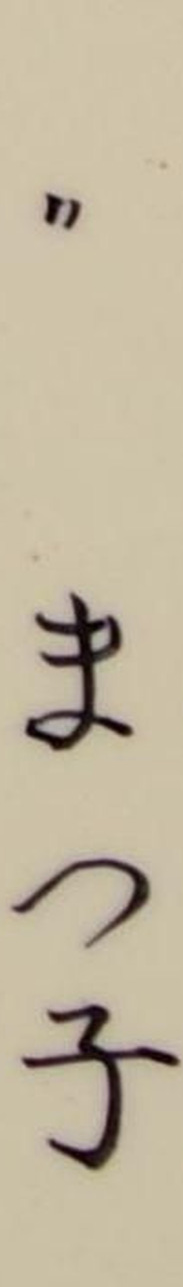まつ子
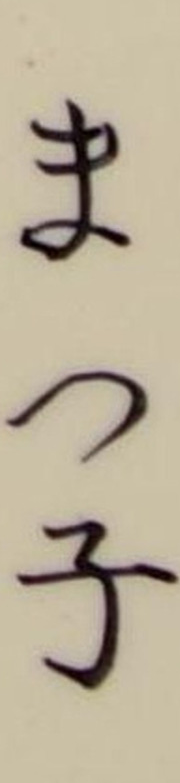まつ子
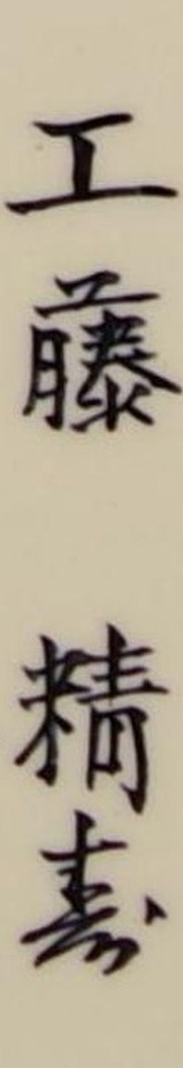工藤精寿
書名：A~D
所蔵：koyasan kongobuji
